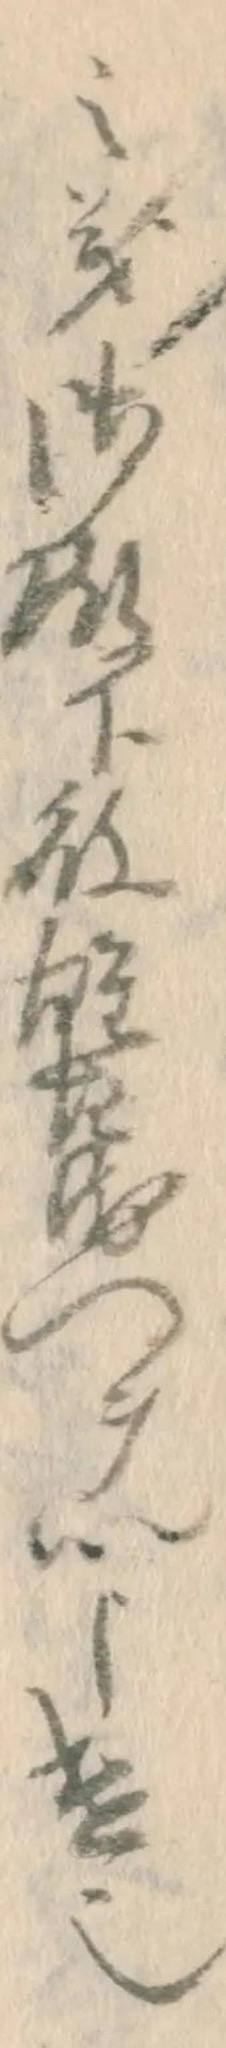之義御殿下彼権左衛門ヲ以被遣之
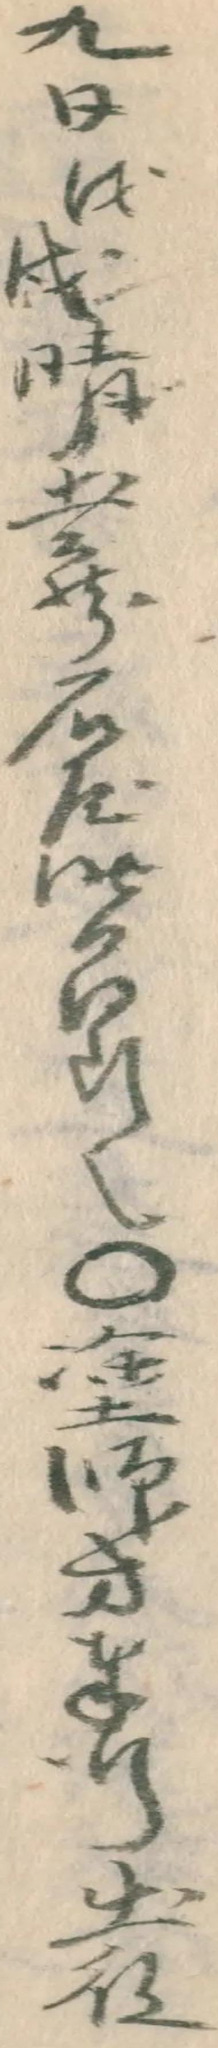九日戊戌晴土蔵石屋昨日同断也○塗師方奉行出役
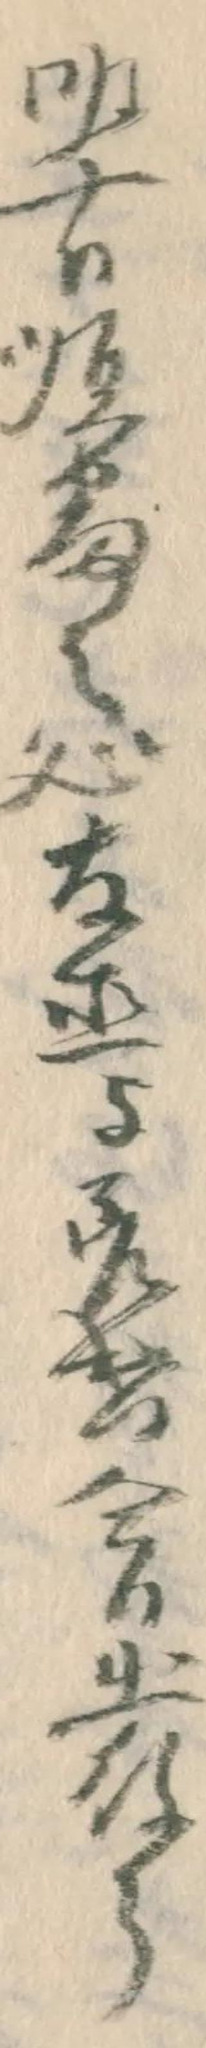明十日順番之処友直と差出候今日出役了
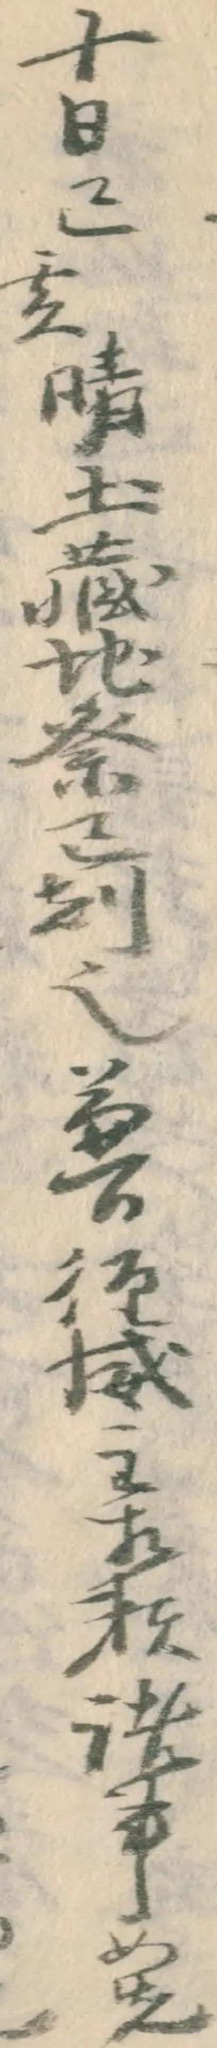十日己亥晴土蔵地祭巳刻也兼而経威主相頼諸事如先
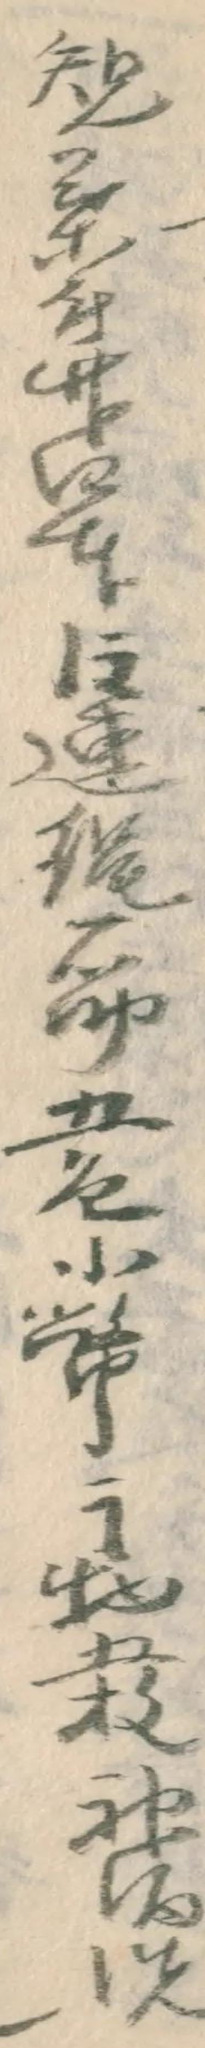規葉付竹四本柱連縄一筋五色小幣干物五枚神酒洗
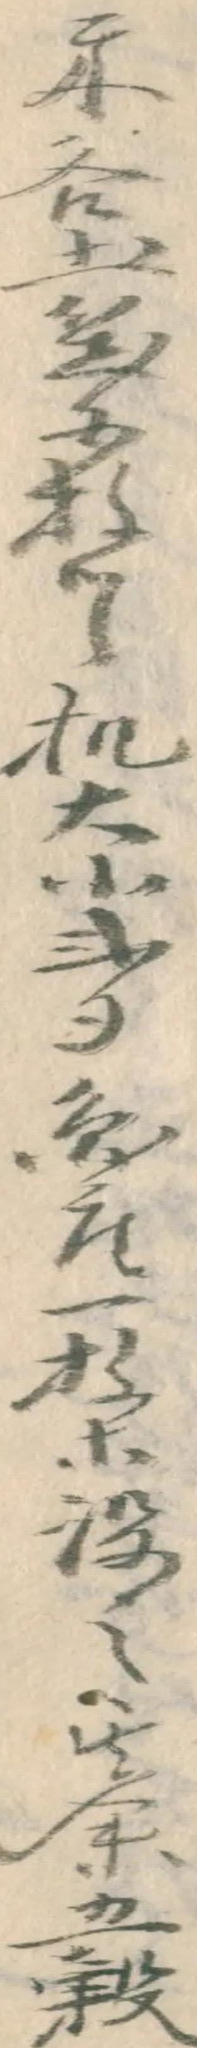米各土器五枚ツヽ机大小弐両円座一枚等設之其余五穀
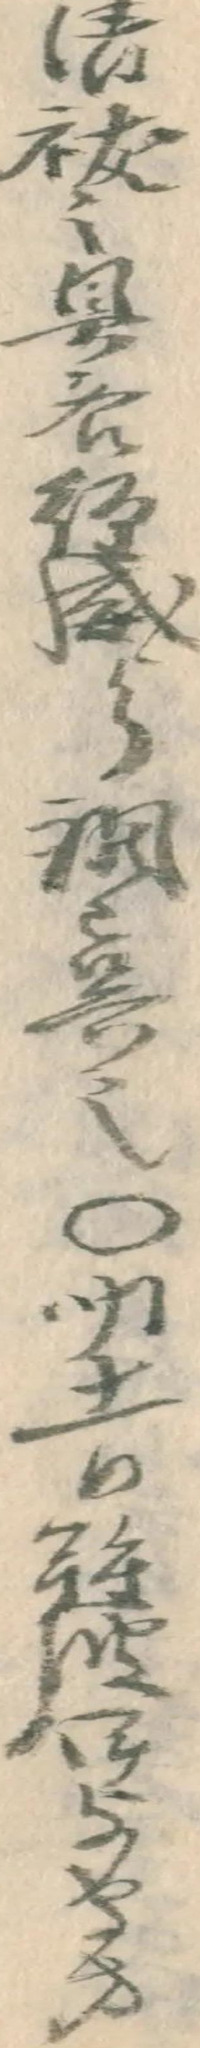清祓之具各経威より調立呉也○明十一日難波伊与守方
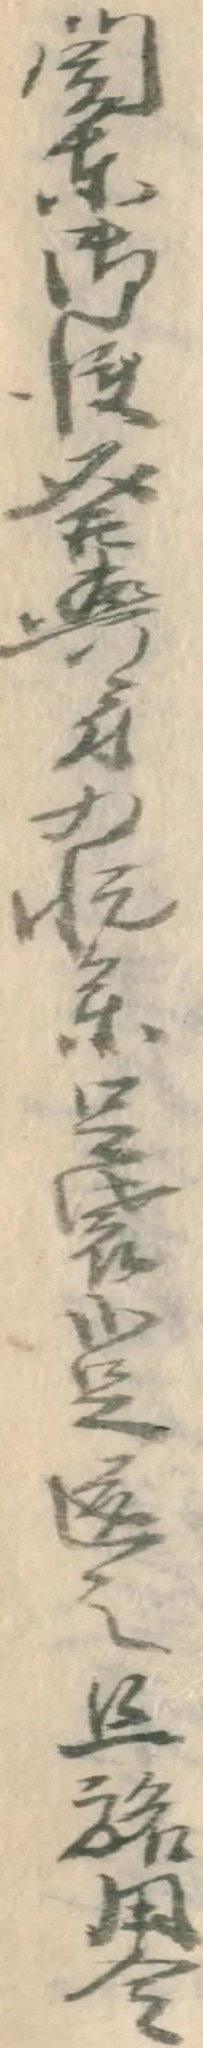関東御使発輿に付為祝参足袋弐足送之且旅用金

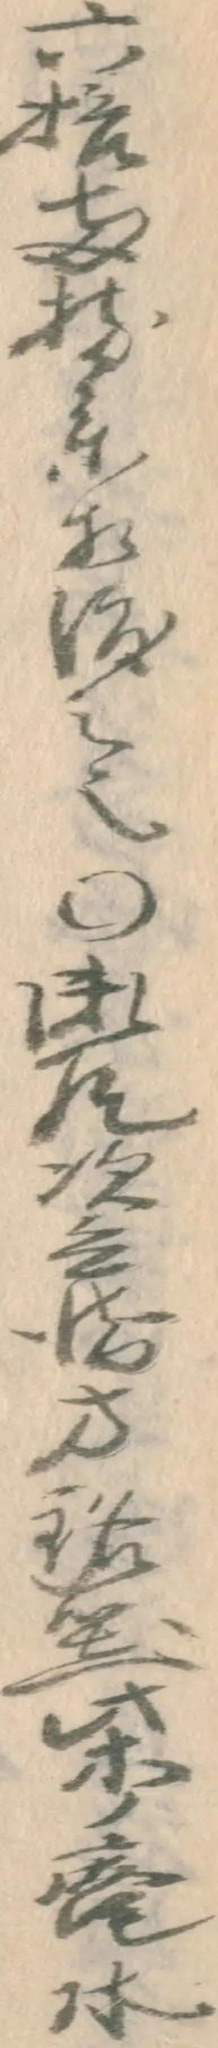六拾両持参相渡之也○瀬尾次兵衛方銘器此木ノ庵水
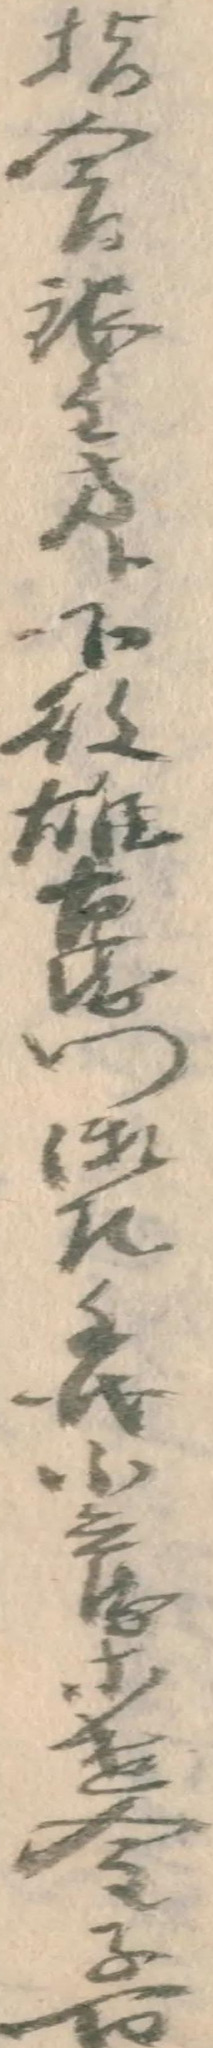指今日銀主方え下役雄左衛門瀬尾手代小兵衛等遣金子百
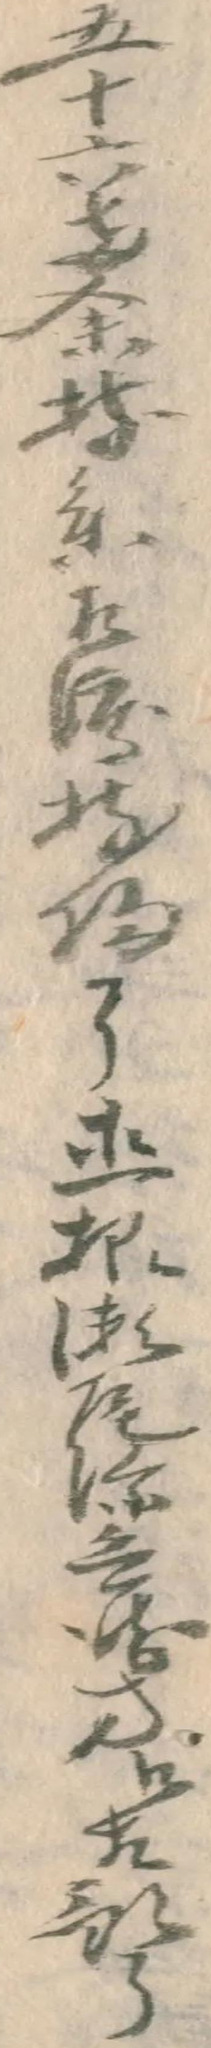五十六両余持参相渡持帰了直様瀬尾弥兵衛方え相預了
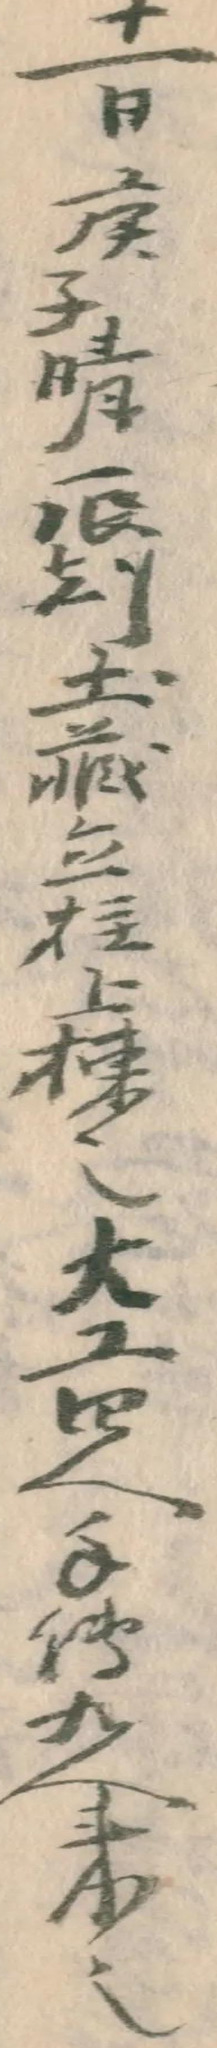十一日庚子晴辰刻土蔵立柱上棟也大工四人手傳九人来也
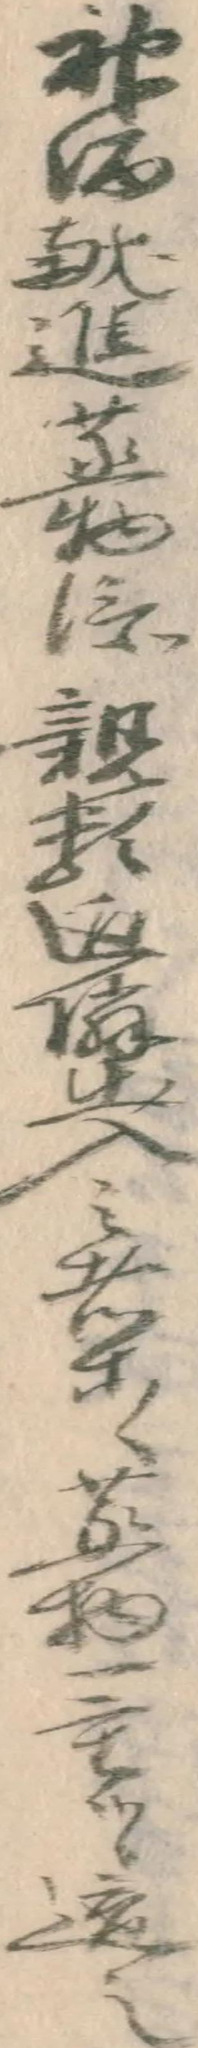神酒献進蒸物添親類近隣出入之者等へ蒸物一重ツヽ送之
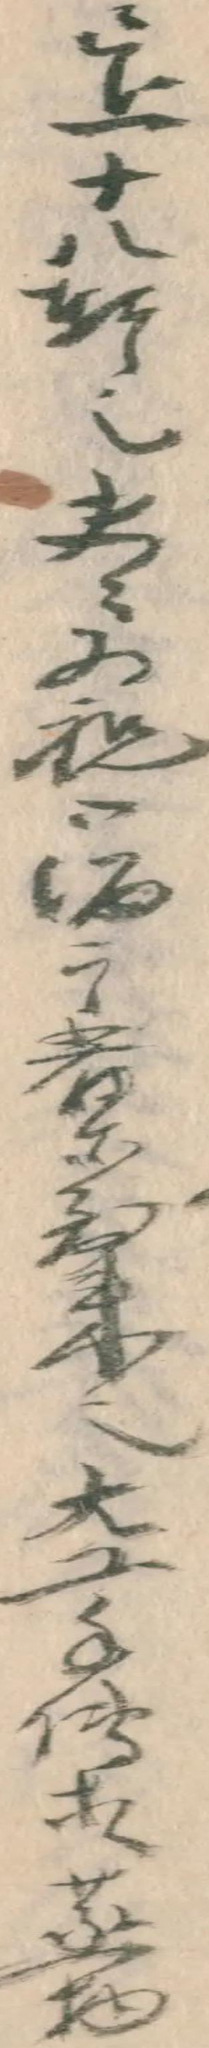已上十八軒也夫々為祝御酒干肴等到来也大工手傳等へ蒸物
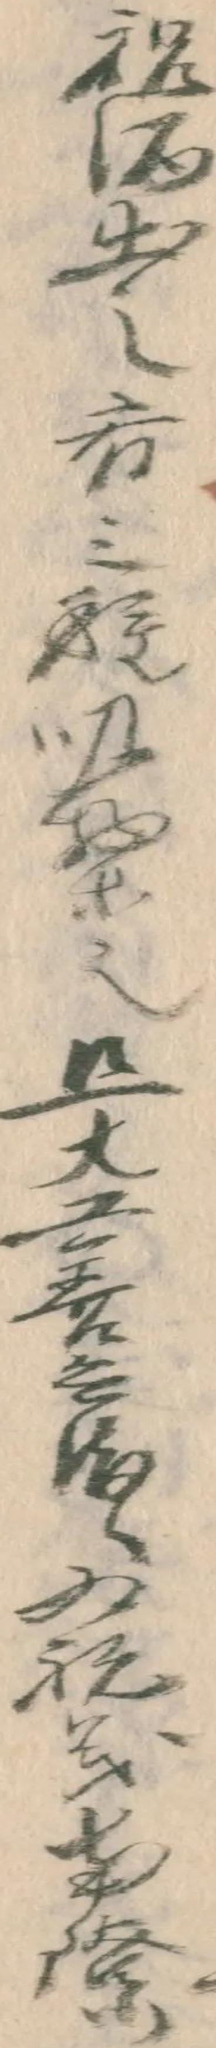祝酒出之肴三種吸物等也且大工又兵善兵衛へ為祝義南鐐御
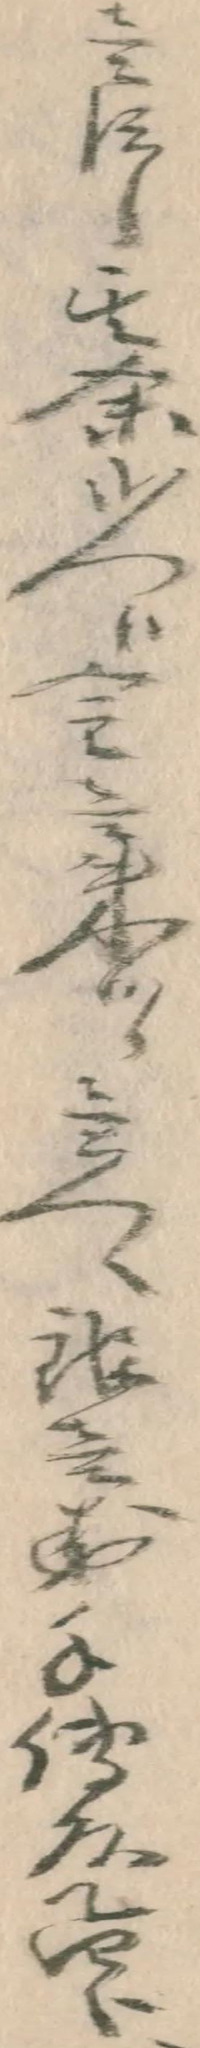壱俵候其余弐人え金壱朱ツヽ壱人へ銀壱歩手傳衆四分
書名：賀茂社記録. 第67冊
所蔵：国立国会図書館 National Diet Library, JAPAN
